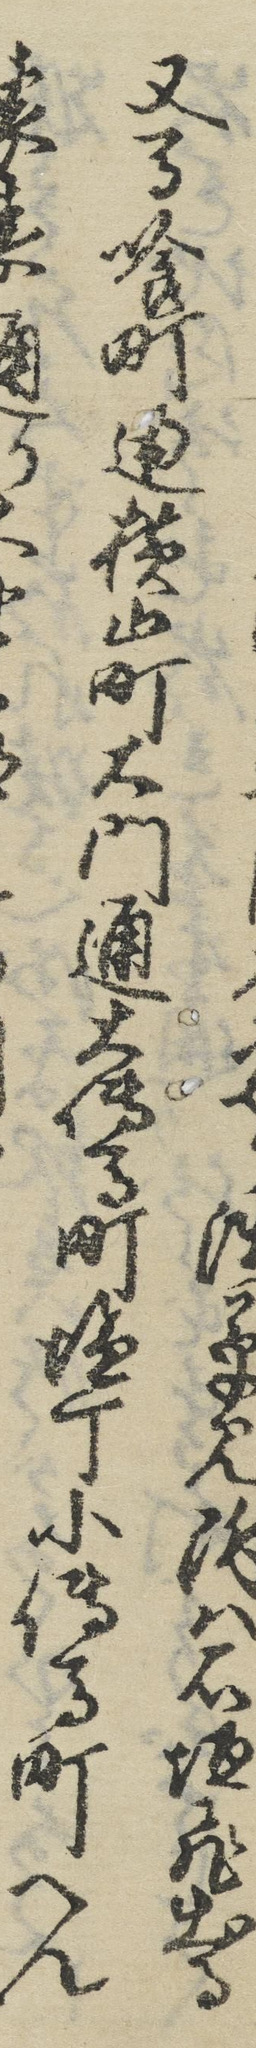又馬喰町通横山町大門通大伝馬町塩丁小伝馬町へん
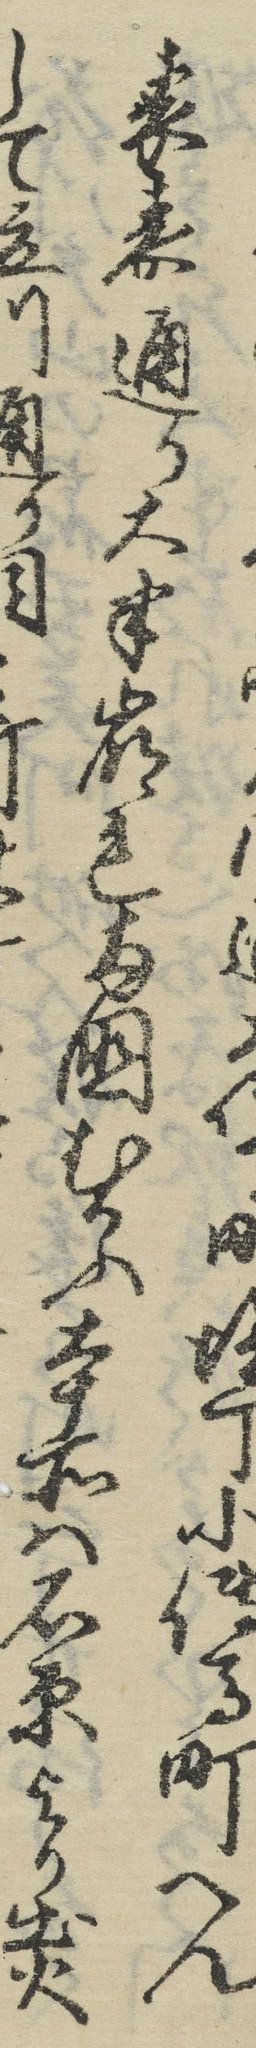裏表通り大半崩れ両国むかふ本所ハ石原より出火
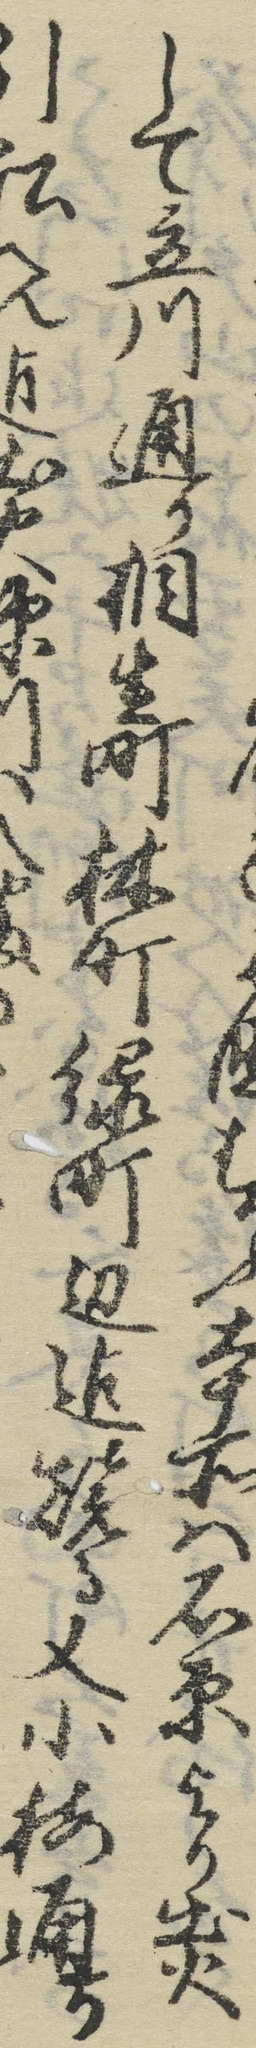して立川通り相生町林町緑町辺迄焼る又小梅通り
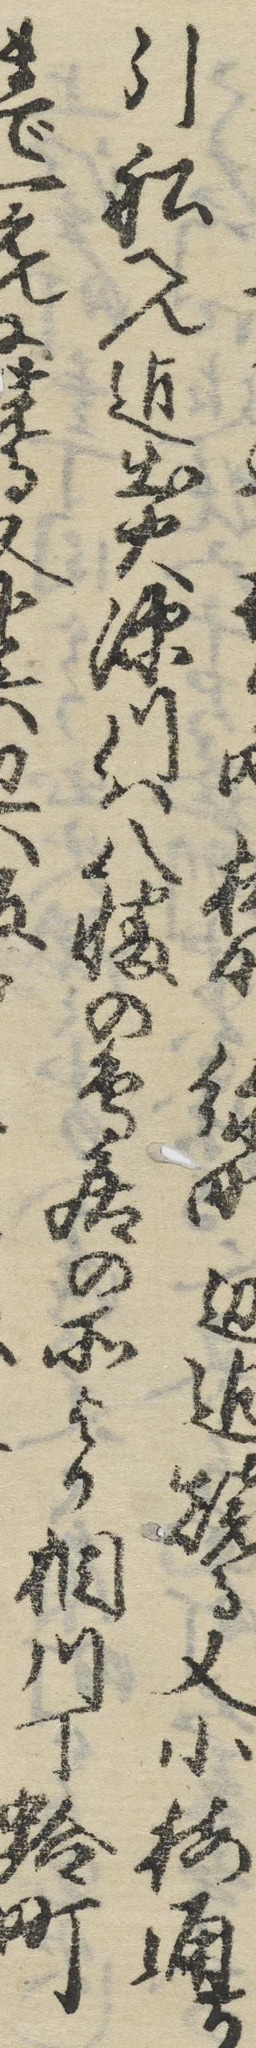引船へん迄出火深川ハ八幡の鳥居の所より相川丁蛤町
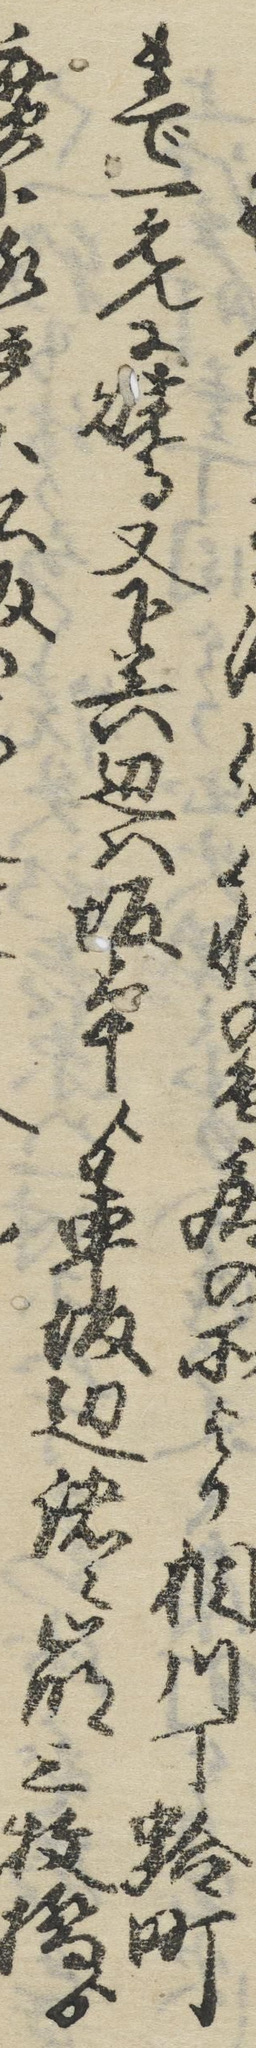まで一えんに焼る又下谷辺ハ坂本ゟ車坂辺諸々崩三枚橋ゟ
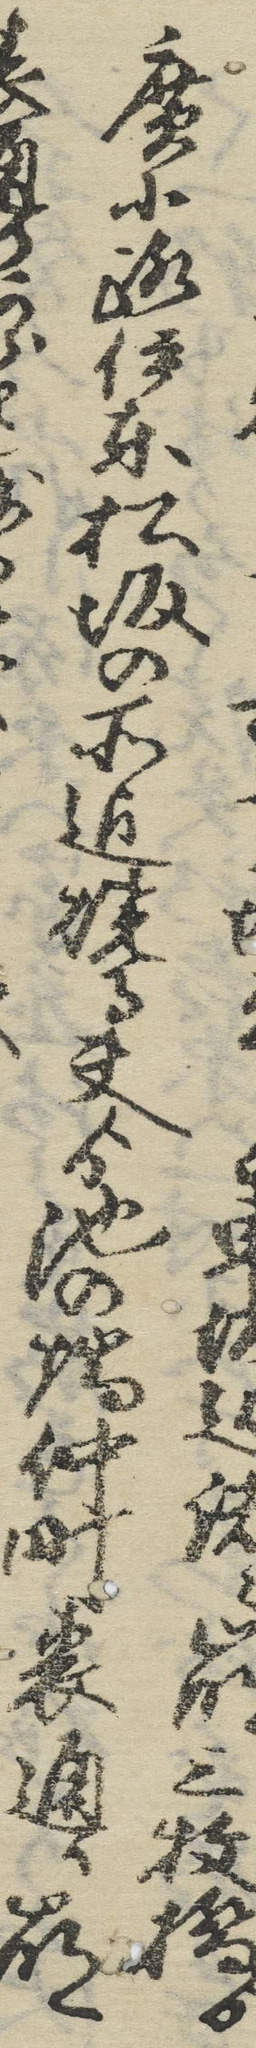広小路伊東松坂の所迄焼る夫ゟ池の端仲町裏通り崩
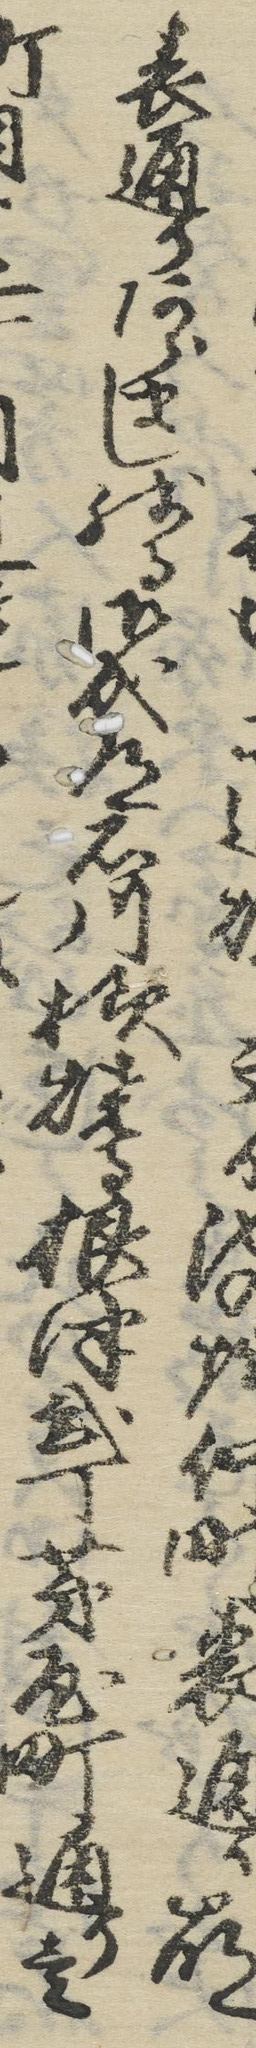表通りあらまし残る御成道石川様焼る根津弐丁茅屋町通り壱
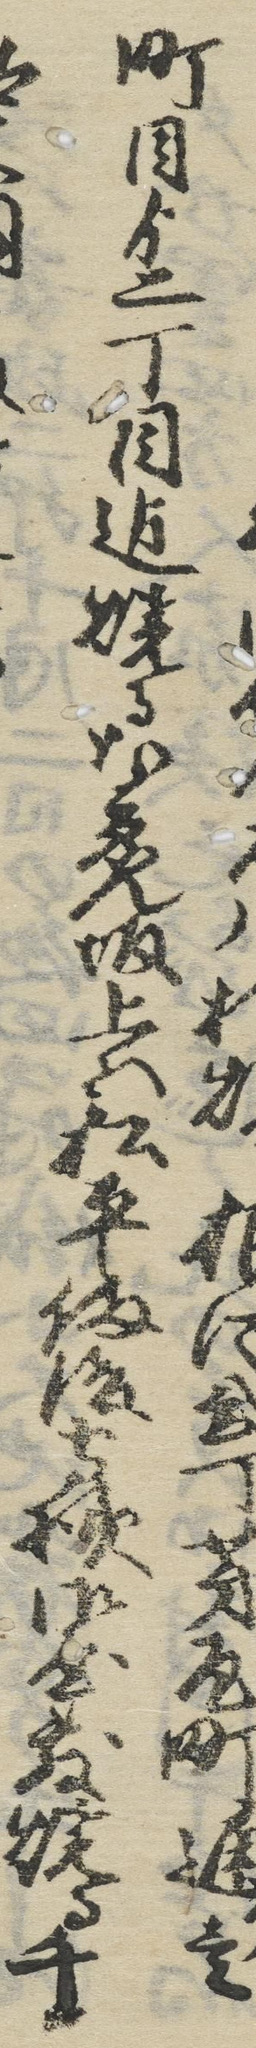町目ゟ二丁目迄焼るむゑん坂上ハ松平備後守様御屋敷焼る千
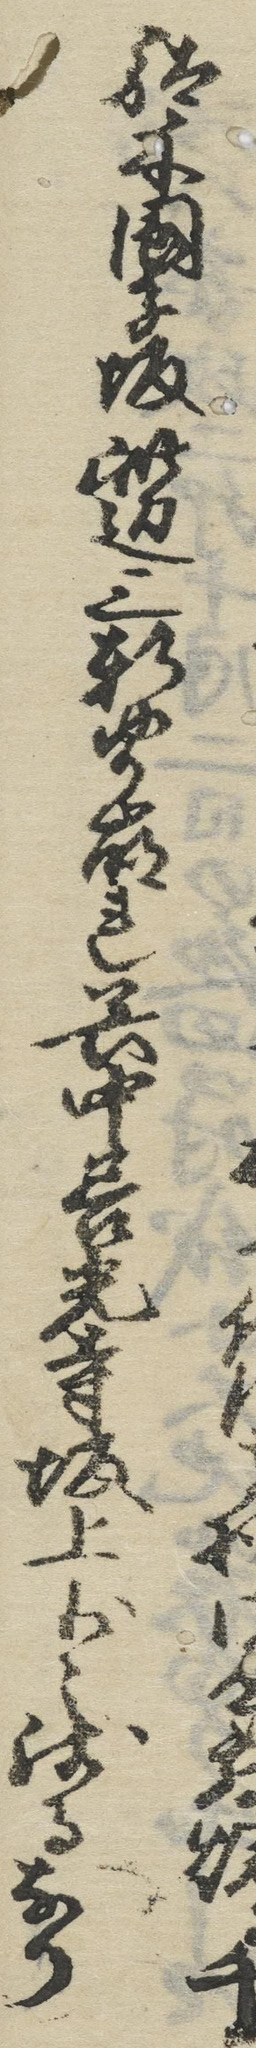駄木団子坂此辺三軒ゆり崩れ谷中善光寺坂上少々残るなり
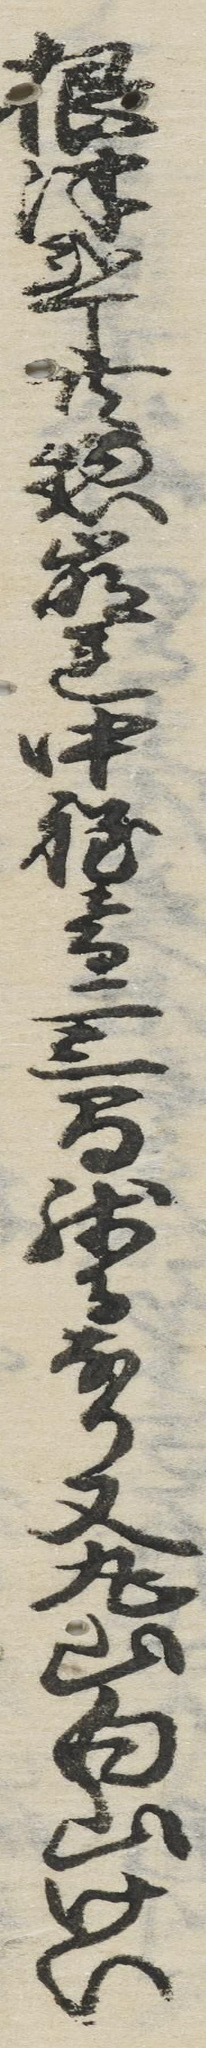根津弐丁共惣崩れ中程ニ而二三間残るなり又丸山白山けい
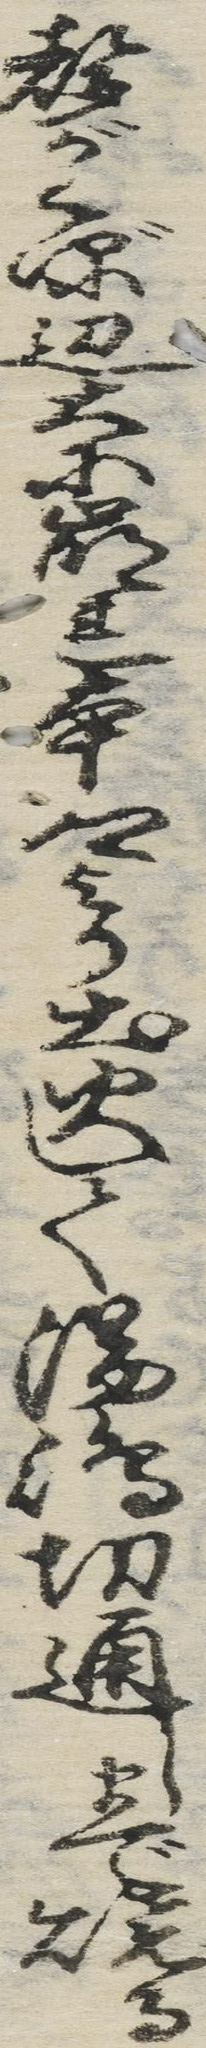声がくぼ辺大に崩れ本郷より出火して湯島切通しまで焼る
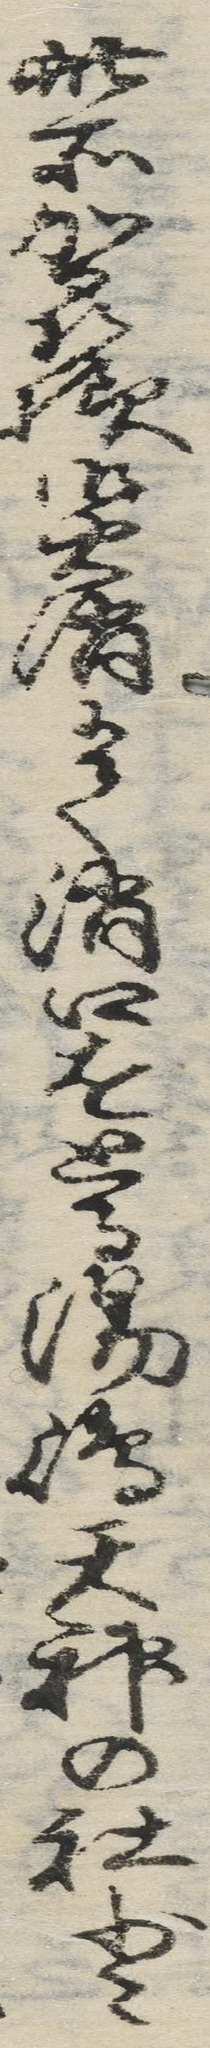此所加州様御火消にて消口をとる湯島天神の社少々
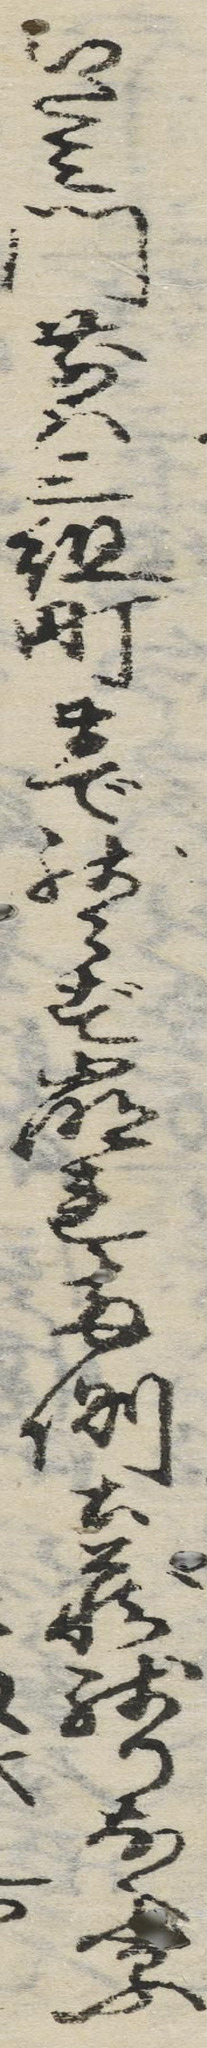いたミ門前ハ三組町まで残らず崩れる両側土蔵残りなくふるふ
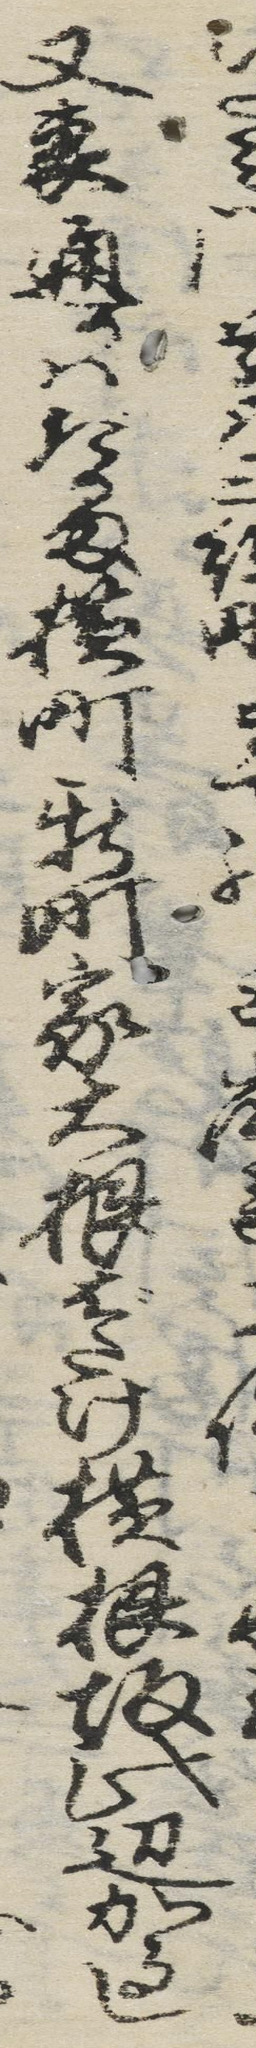又裏通りハたかま横町新町家大根ばたけ横根坂此辺かるし
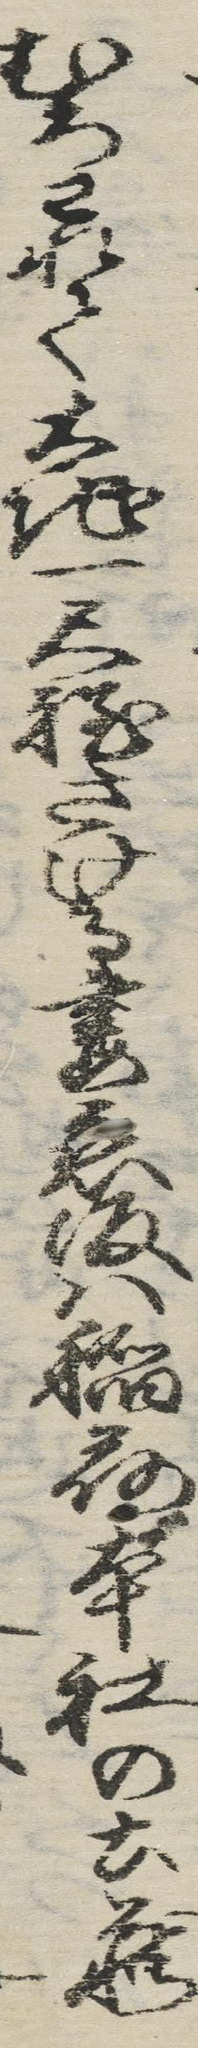むろわれて大地一尺程さける妻恋坂ハ稲荷本社の土蔵
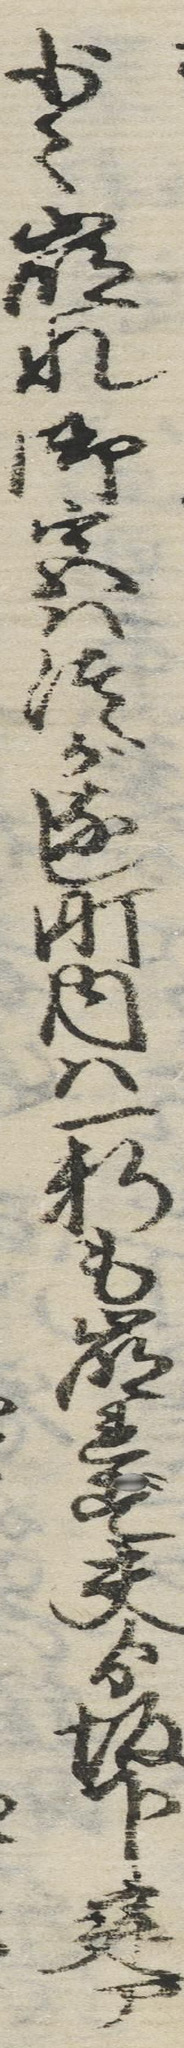少々崩れ御宮ハつゝがなし町内ハ一軒も崩れず夫ゟ坂下建部
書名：御府内五街道　大地しん
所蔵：東京大学地震研究所図書室 Earthquake Research Institute Library, The University of Tokyo, JAPAN
